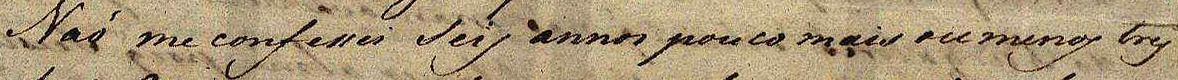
Naõ me confessei seis annos pouco mais ou menos tres
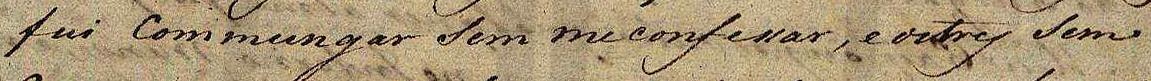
fui commungar sem me confessar, e os tres sem
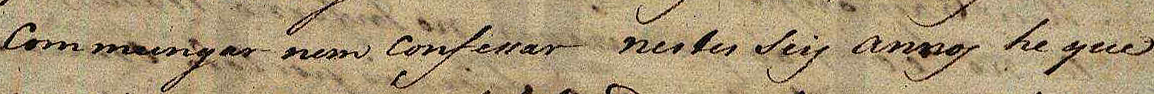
commungar nem confessar nestes seis annos he que
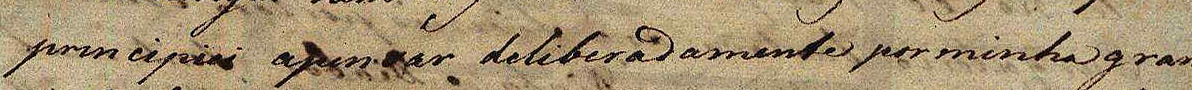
principiei a pensar deliberadamente por minha gran
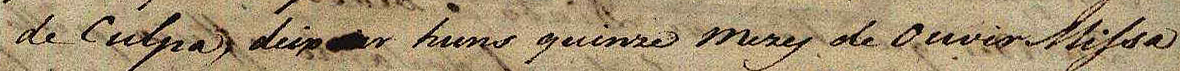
de Culpa, deix_r huns quinze mezes de ouvir Missa
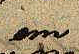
em
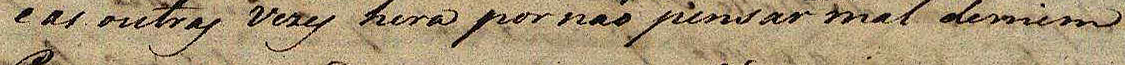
e as outras vezes hera por naõ pensar mal de mim
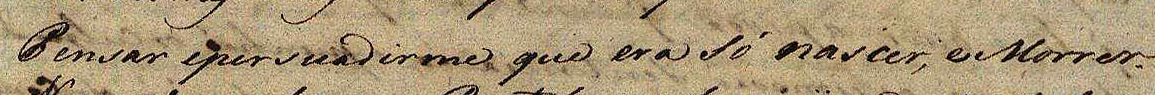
Pensar e persuadirme que era só nascer, e Morrer
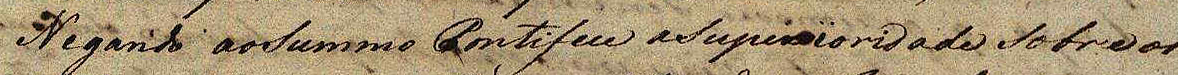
Negando ao Summo Pontifece a Supirioridade sobre os
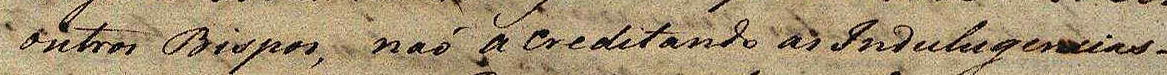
outros Bispos, naõ acreditando as Indulugencias
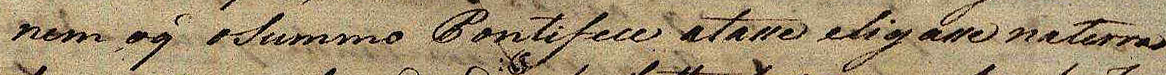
nem o q̄ o Summo Pontifece atasse e ligasse na terra
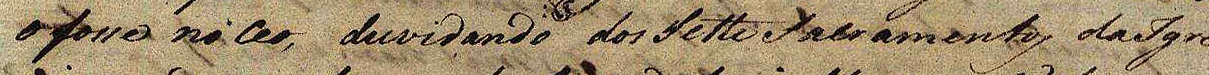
o fosse no ceo, duvidando dos sette sacramentos da Igre
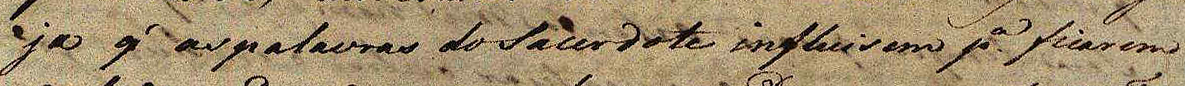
ja q̄ as palavras do sacerdote influisem p.a ficarem
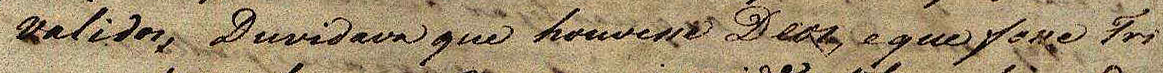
validos, Duvidava que houvesse Deos, e que fosse Tri
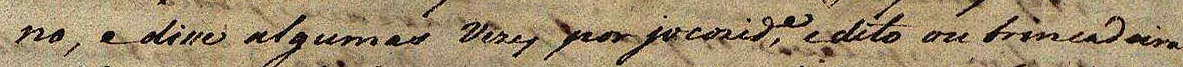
no, e disse algumas vezes por jocozid.e, e dito ou brincadeira
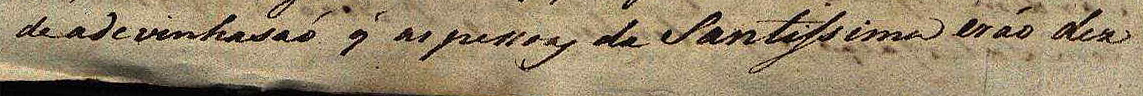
de adevinhasaõ q̄ as pessoas da Santissima eraõ dez
